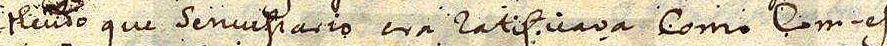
theudo que Se necessario era Ratificava Como Com-ef
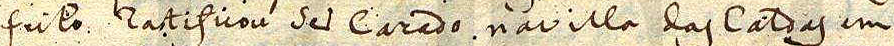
feito Ratificou ser Cazado na villa das Caldas em
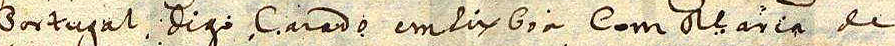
Portugal digo, Cazado em Lixboa Com Maria de
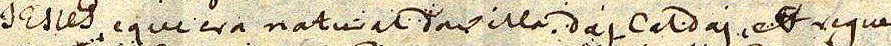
IEsus e que era natural da villa das Caldas, e Fregue
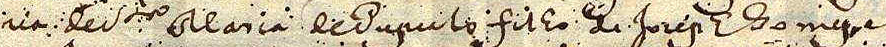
sia de S.ta Maria de Pupulo filho de Jozeph Gomes e
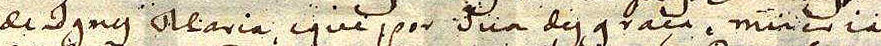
de Ignes Maria, e que por sua desgraça, e mizeria
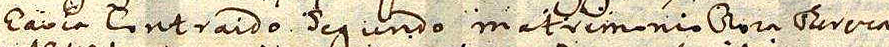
havia Contraido Segundo matrimonio Roza Thereza
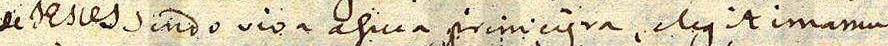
de Iesus sendo viva a sua primeyra, e legitima mu
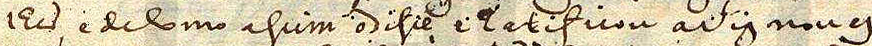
lher, e de Como assim o disse, e Ratificou asignou es
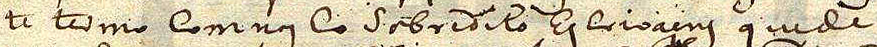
te termo ComnosCo Sobredito EsCrivaens que de
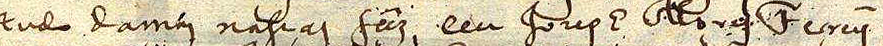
tudo damos nossas féez, e eu Jozeph Alvres Ferrey
